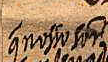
q̄ nosso sor̄
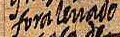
fora leuado
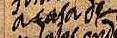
a casa de
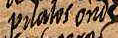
pilatos onde
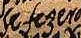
se fezera
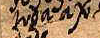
toda a ꝟ
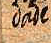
dade
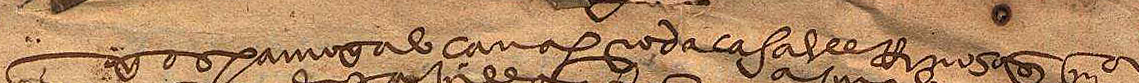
item gaspar uogado cauaLro da casa dell Rei noso s̄r mor
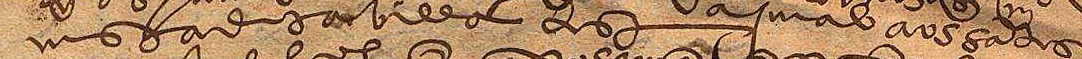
nesta dita villa testa Jurado aos sātos
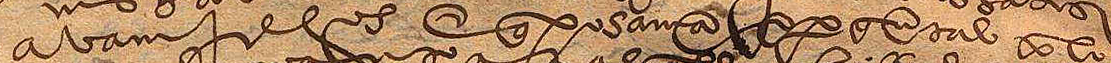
avamJelhos e q̄ pos a mā e ꝑgūtado p̄lo
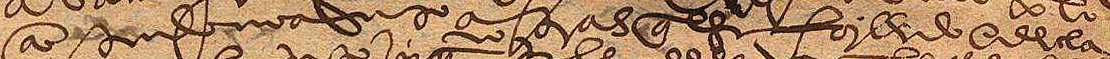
c̄oteudo no auto atras q̄ lhe foj llido e decla
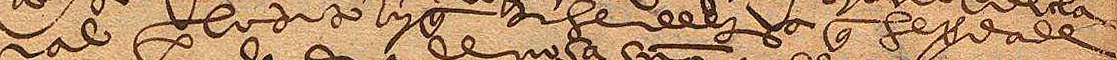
rado p̄lo dito vygro dise elle ta q̄ he ꝟdade
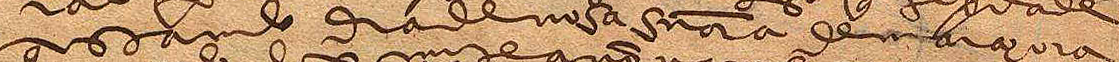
q̄ estando dia de nosa snōra de março ora
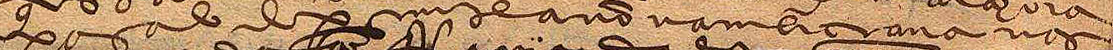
pasado do ꝑsemte anō na merceana nas
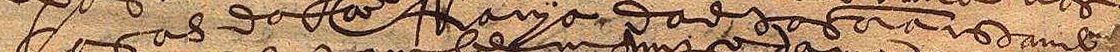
casas da cōffrarya da dita sōra estando
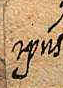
tpūs
